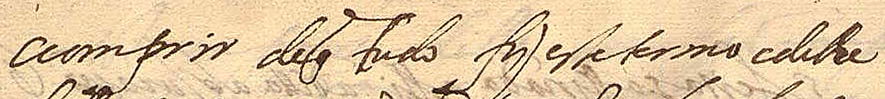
e comprir de q̄ tudo fiz este termo e delle
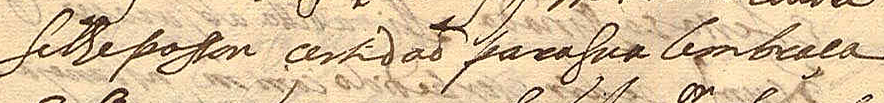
se lhe passou certidaõ para sua lembraça
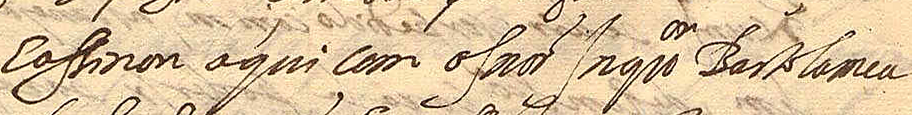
E assinou aqui com o snor̄ Jnquor Bartolameu
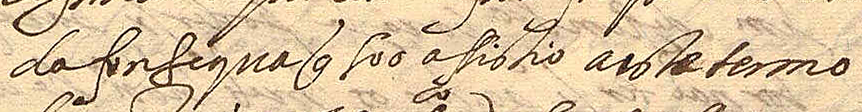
da fonsequa q̄ soo assistio a este termo
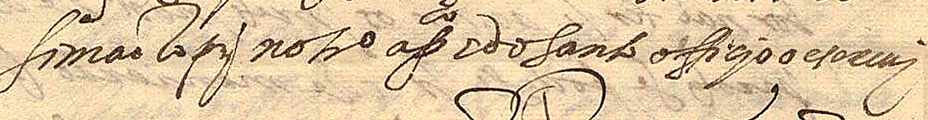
Simaõ lopz̄ notro apco e do santo officio o escreuj
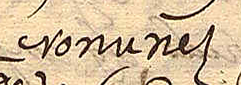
Pero nun̄ez
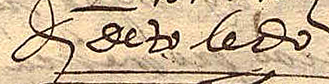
de toledo
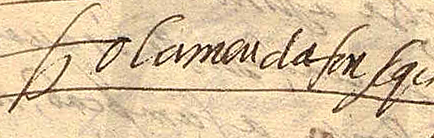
b̄olameu da fonseqa
